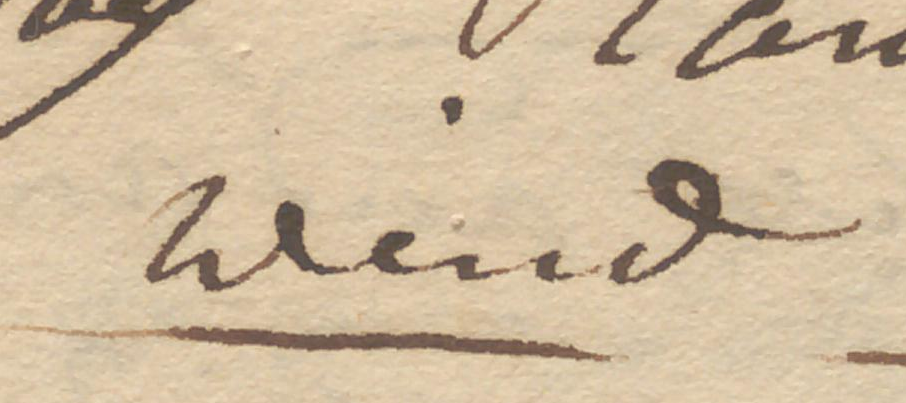wind
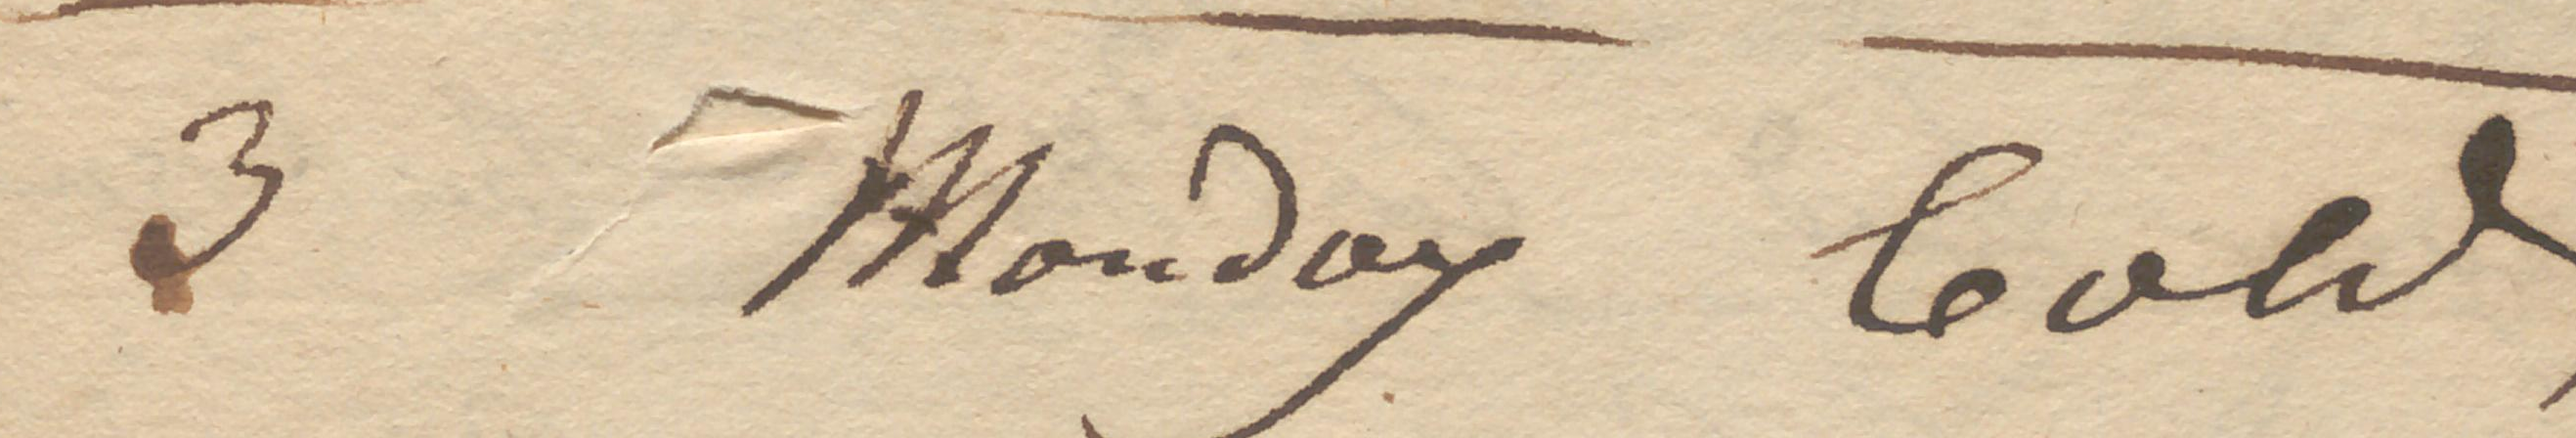3 Monday Cold
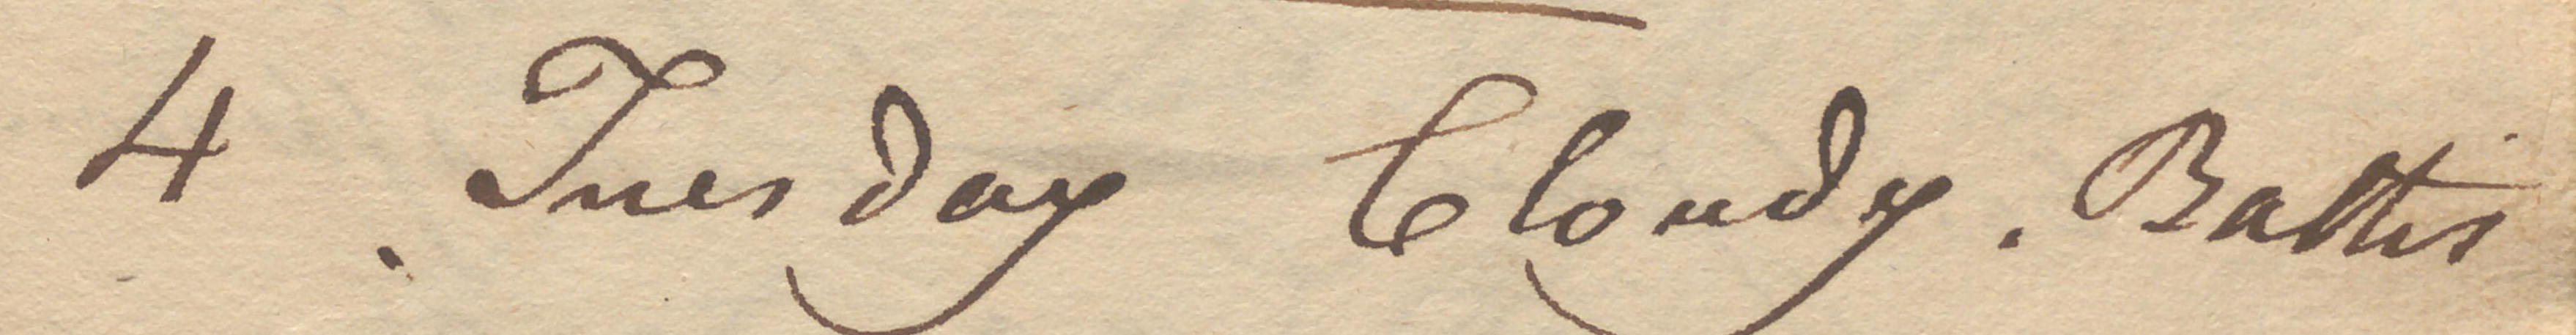4 Tuesday Cloudy, Battie
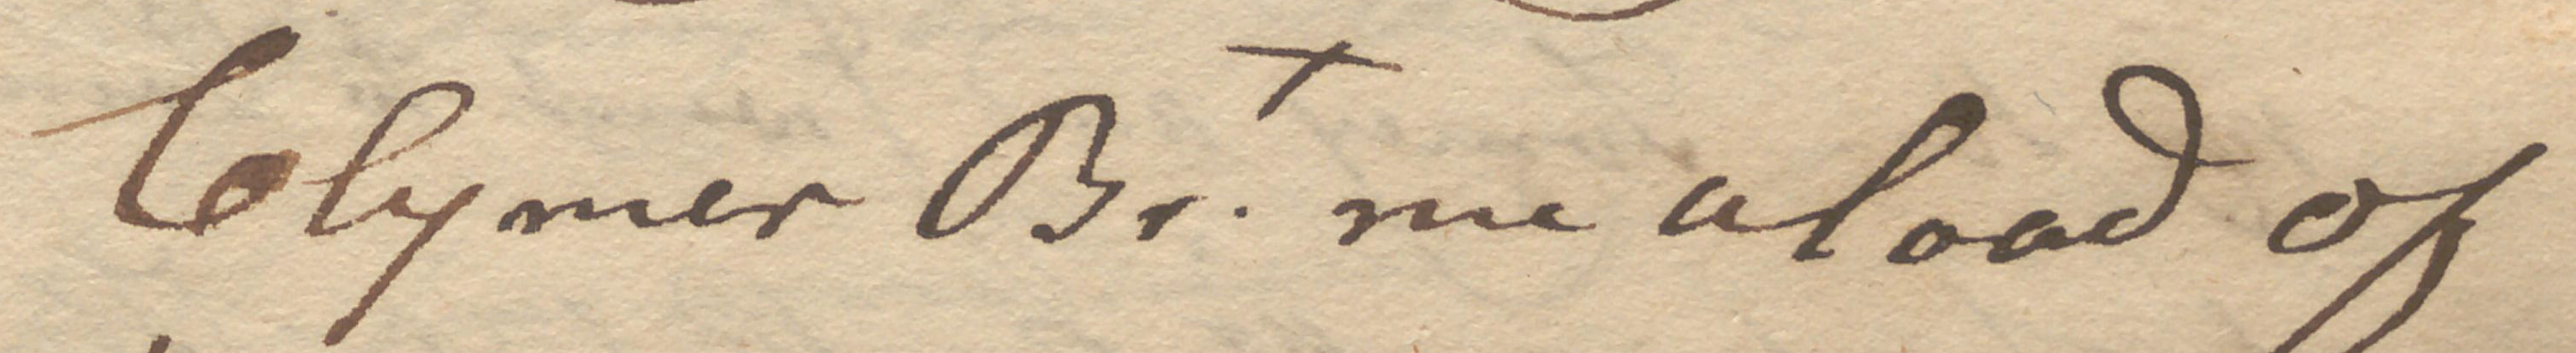Clymer Br^t. me a load of
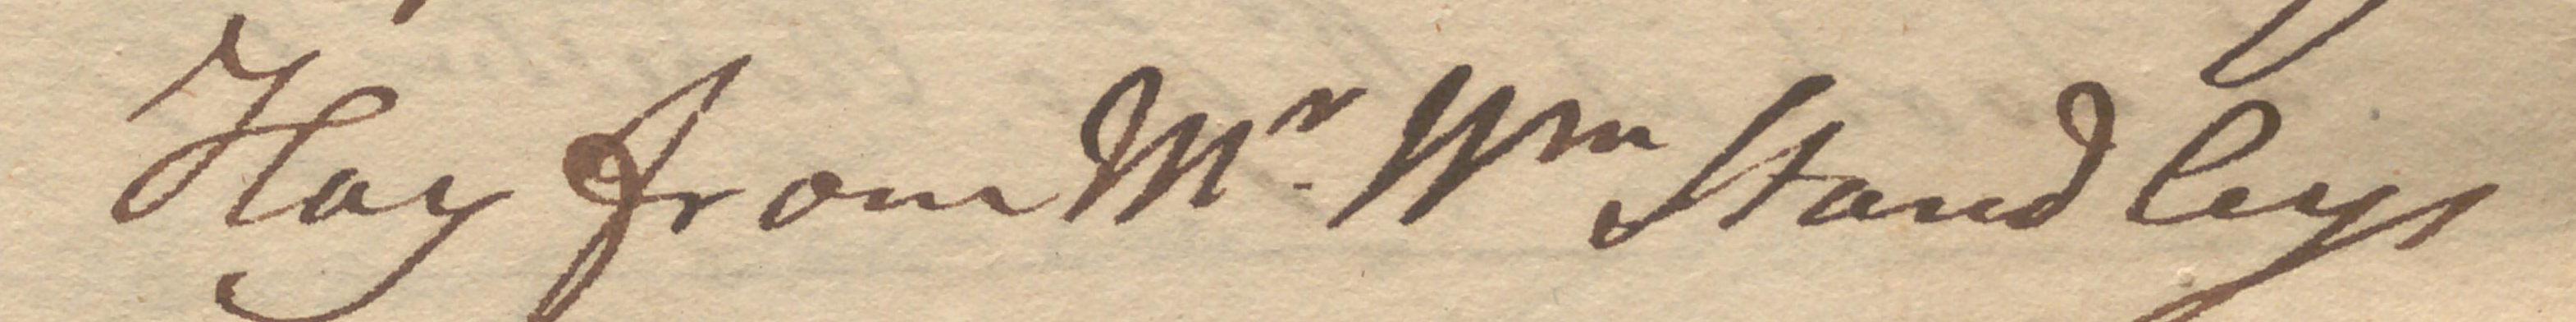Hay from M^r. W^r Standleys
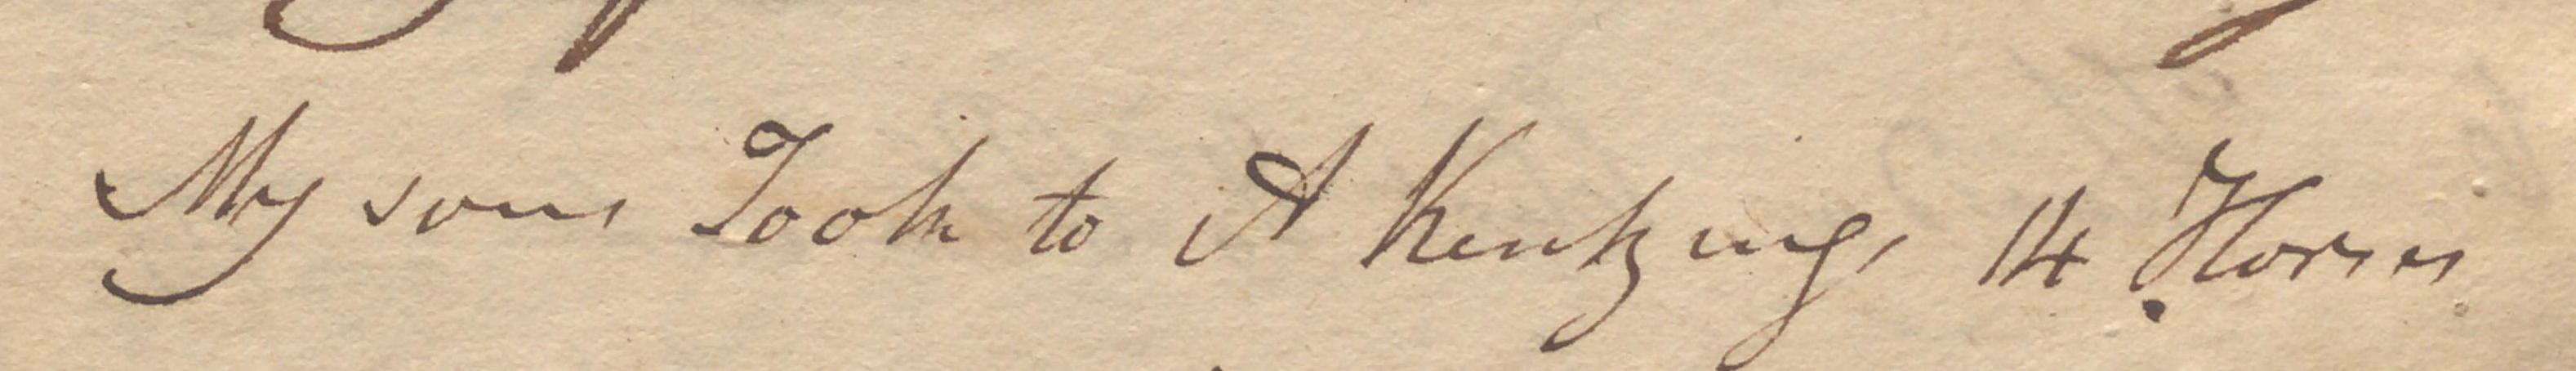My sons Took to A Kintzing 14 Horses
